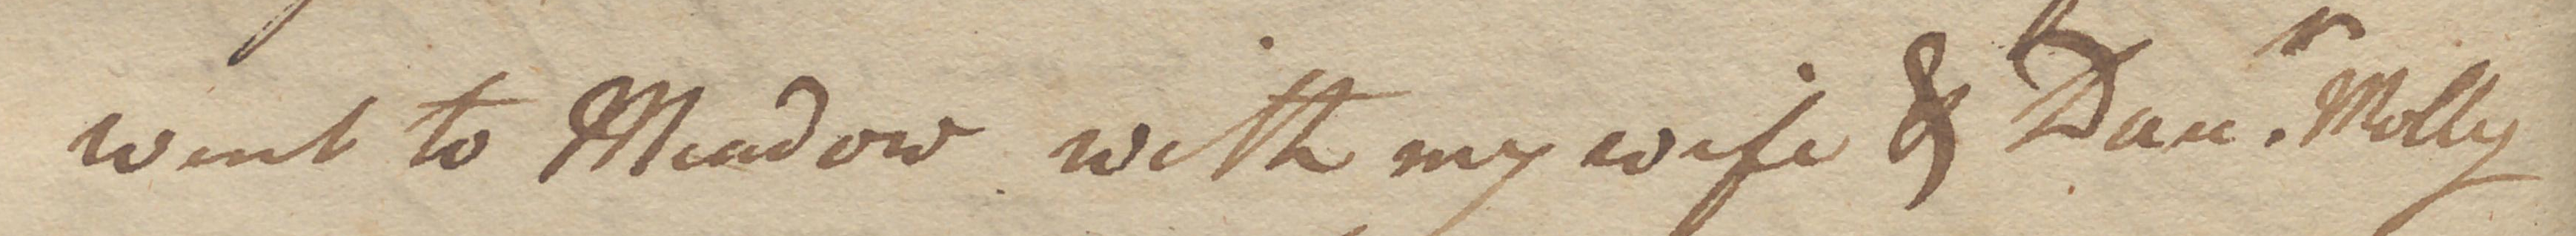went to Meadow with my wife & Dau^r. Molly
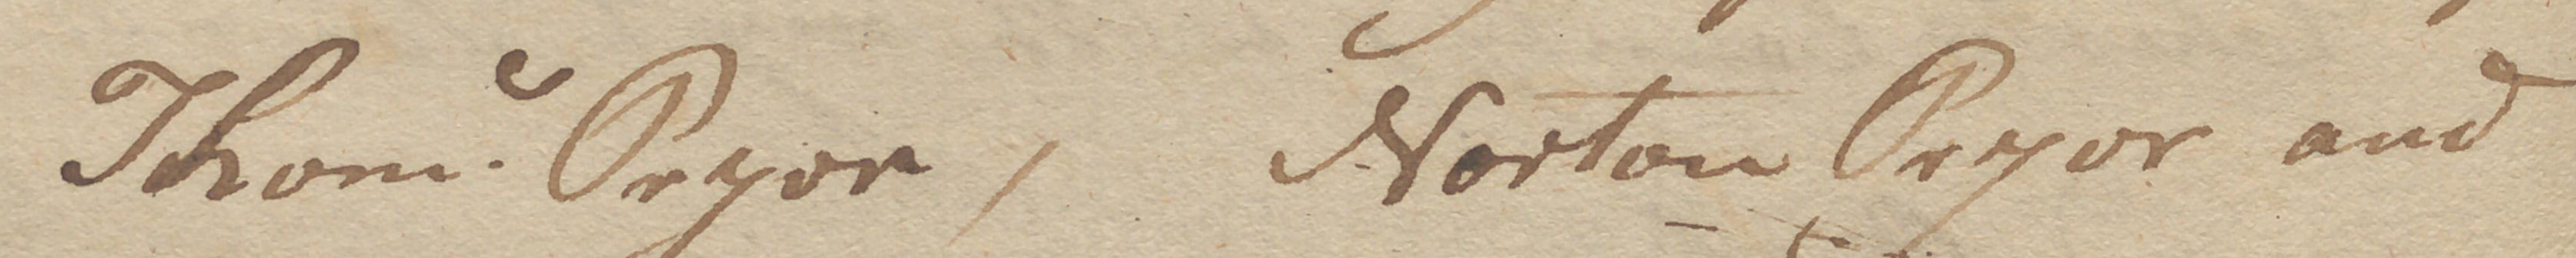Thom^s. Pryor, Norton Pryor and
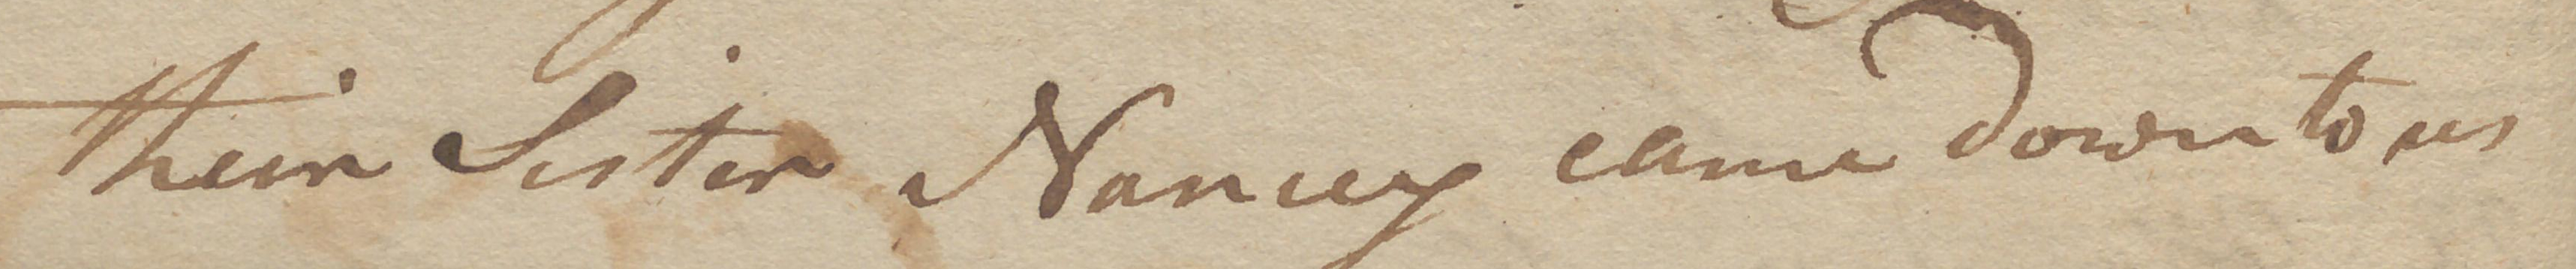their Sister Nancey came down to us
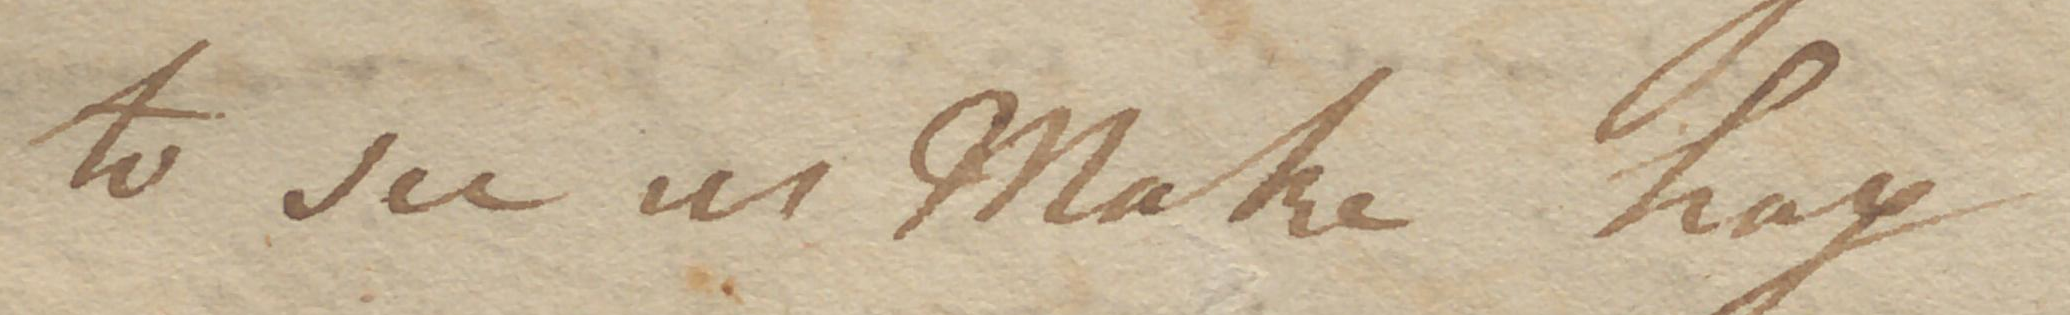to see us Make hay
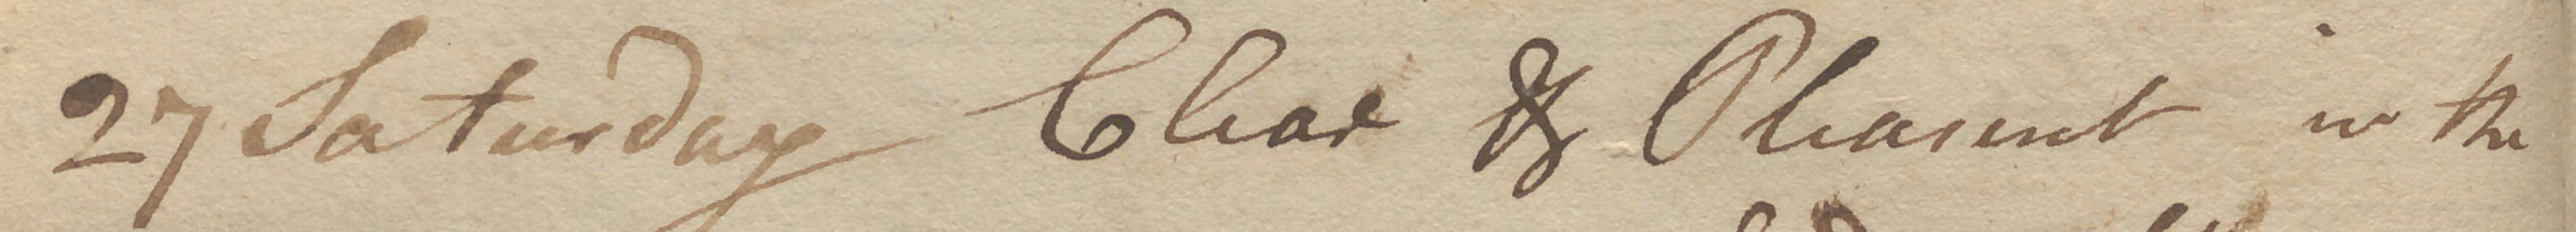27 Saturday Clear & Pleasent in the
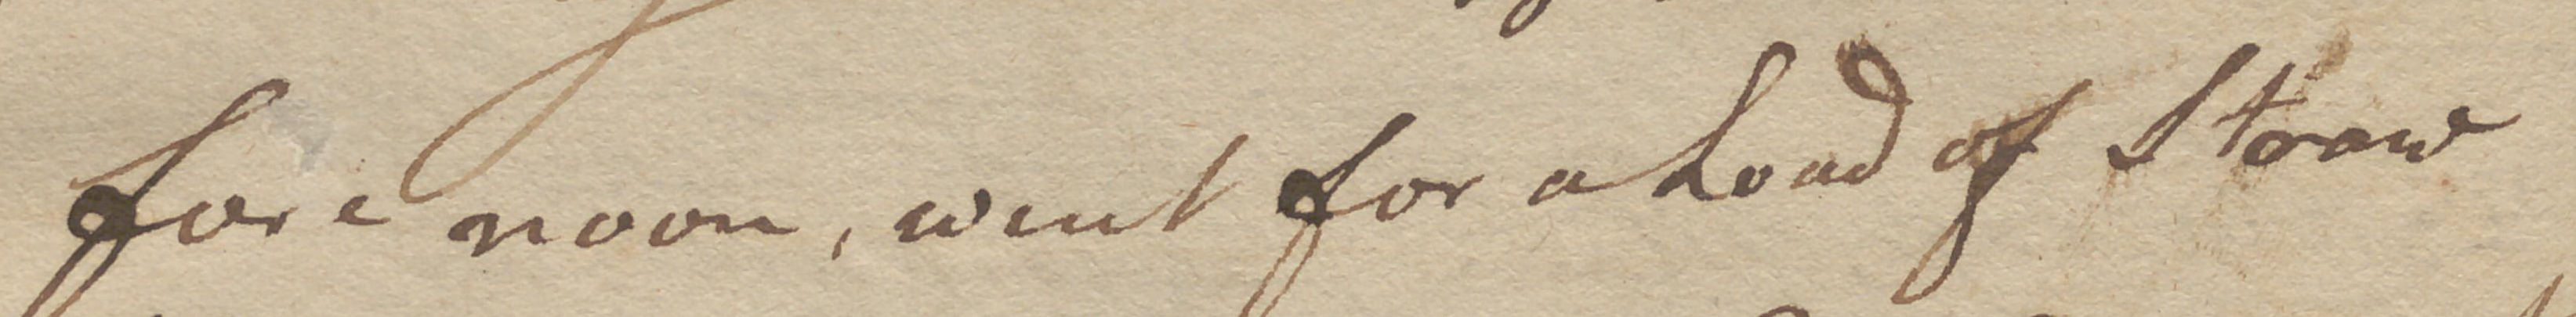fore noon, went for a Load of Straw
